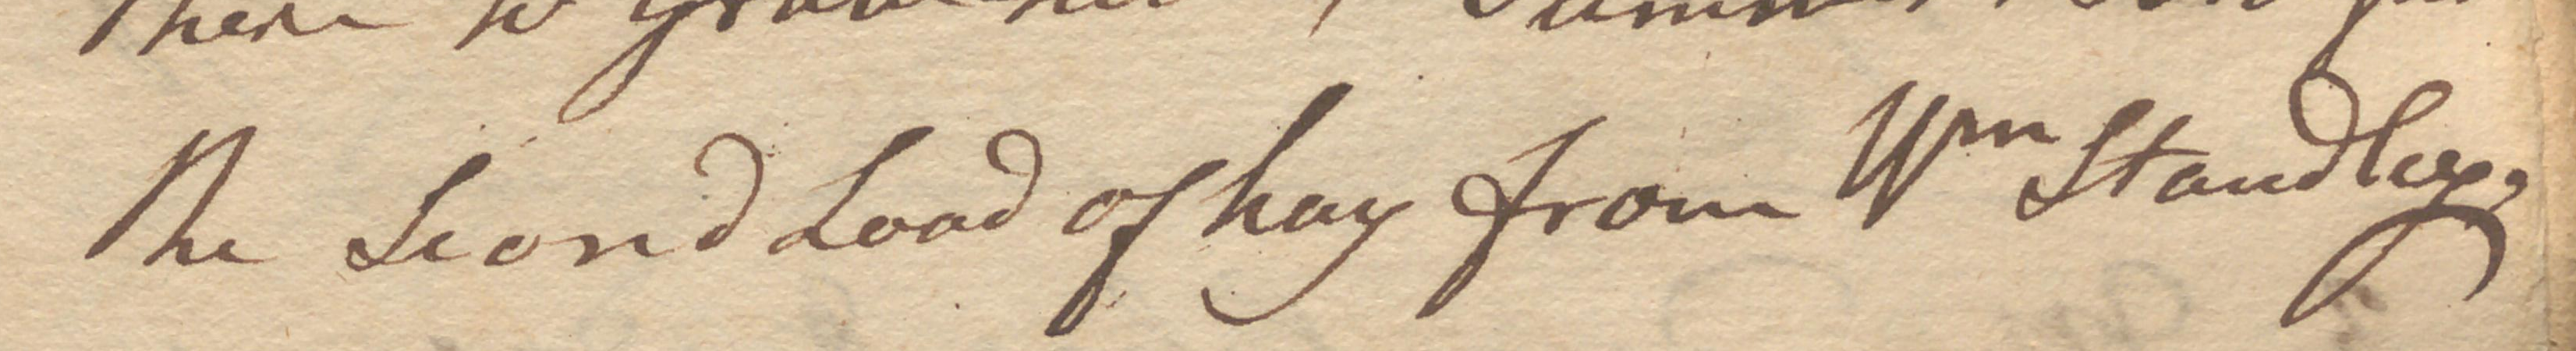the second Load of hay from W^m Standley.
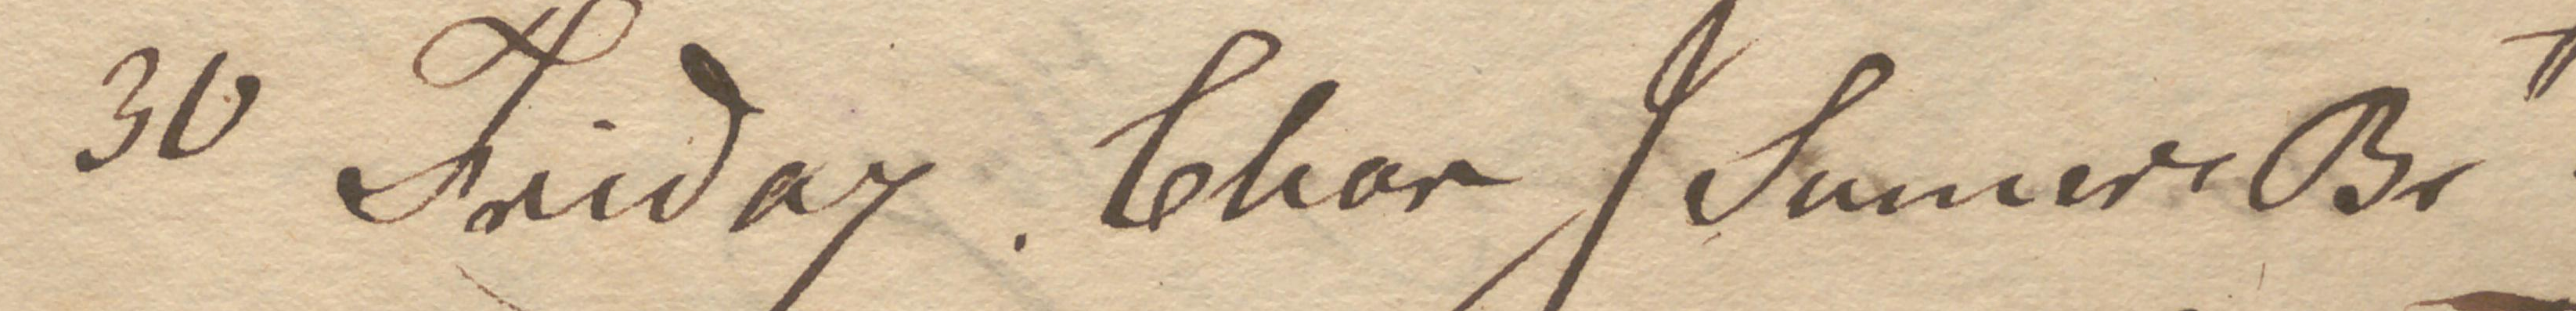Friday Cohear Sumers Br^t
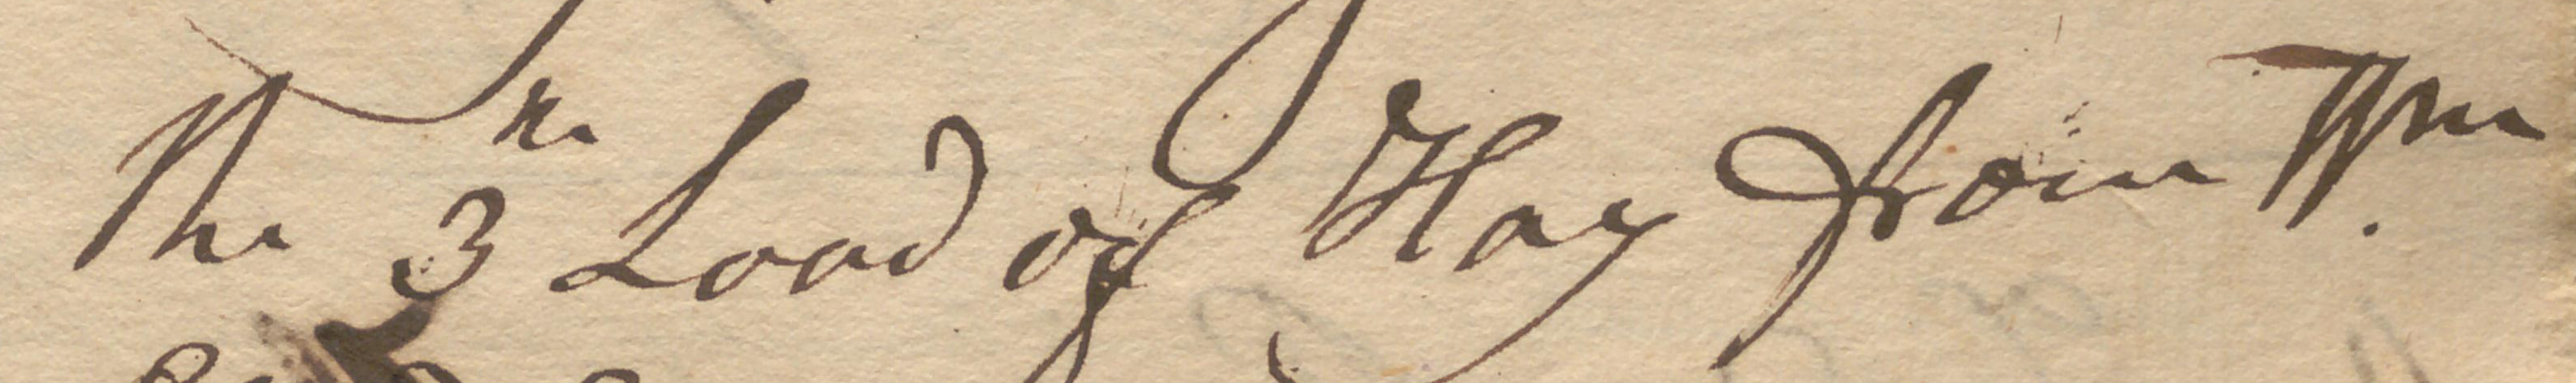the 3^th Load of Hay from W^m.
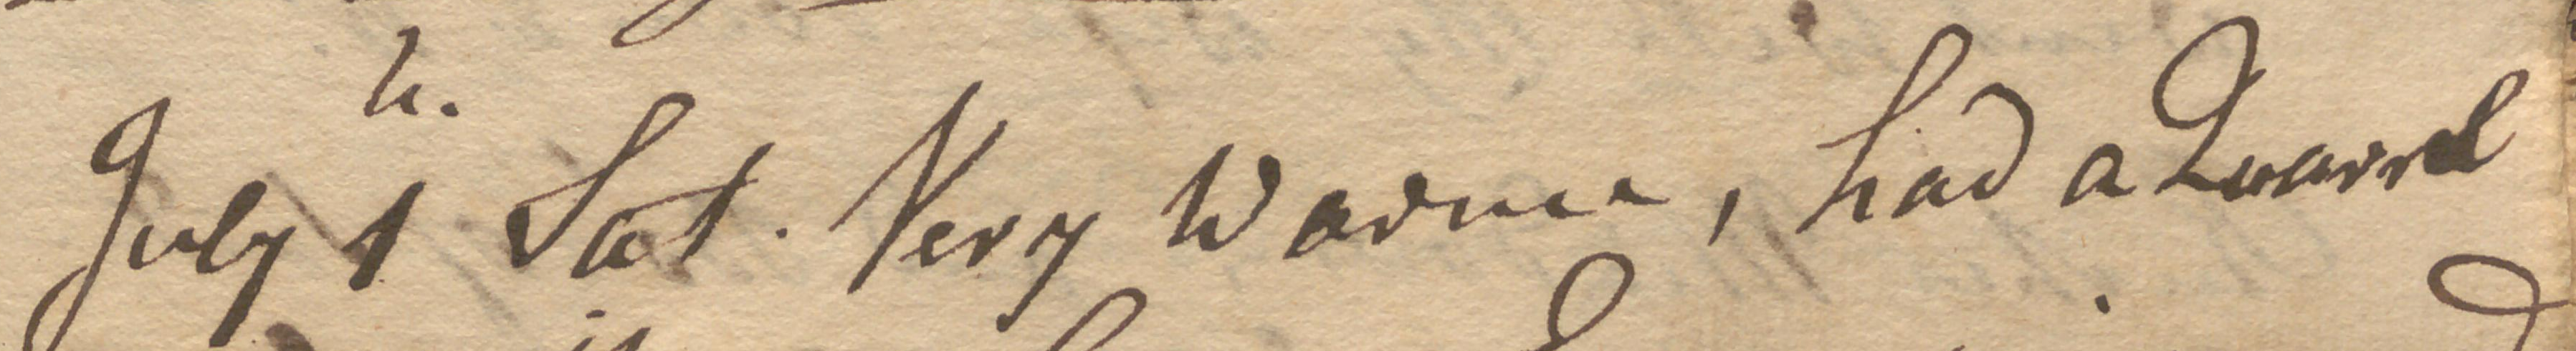July 1^th Sat. Very warme, had a Quarrel
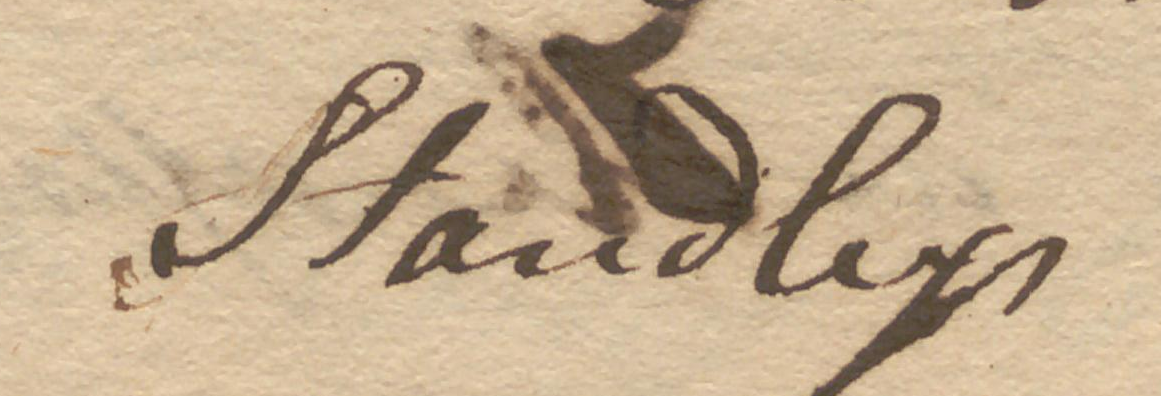Standleys
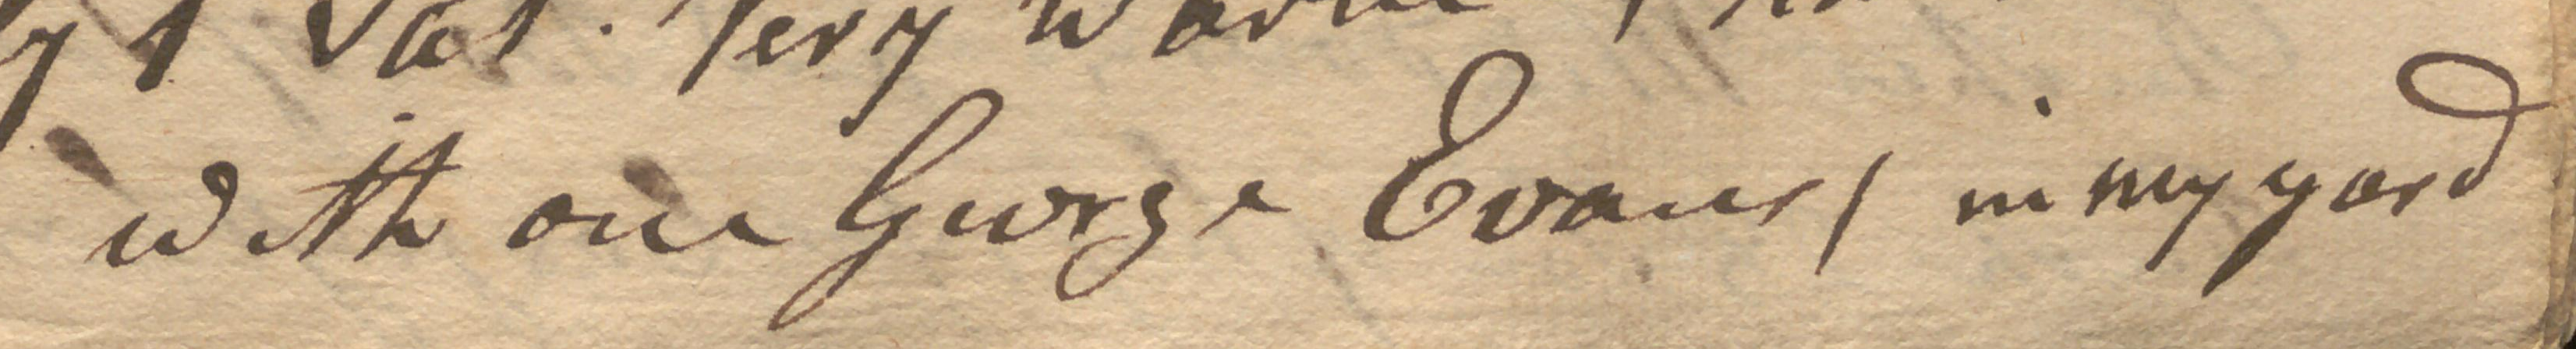with one George Evans / in my yard
